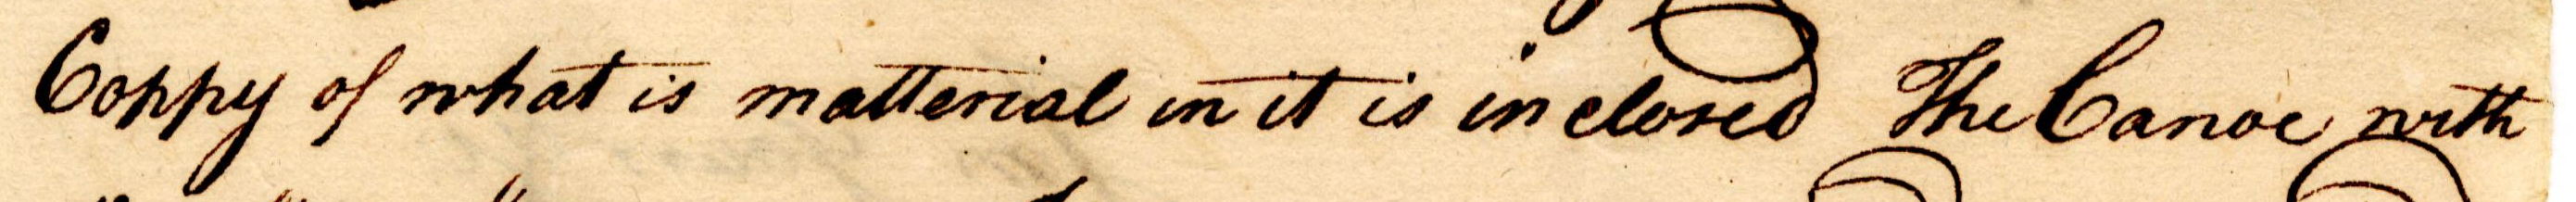coppy of what is matterial in it is inclosed The Canoe with
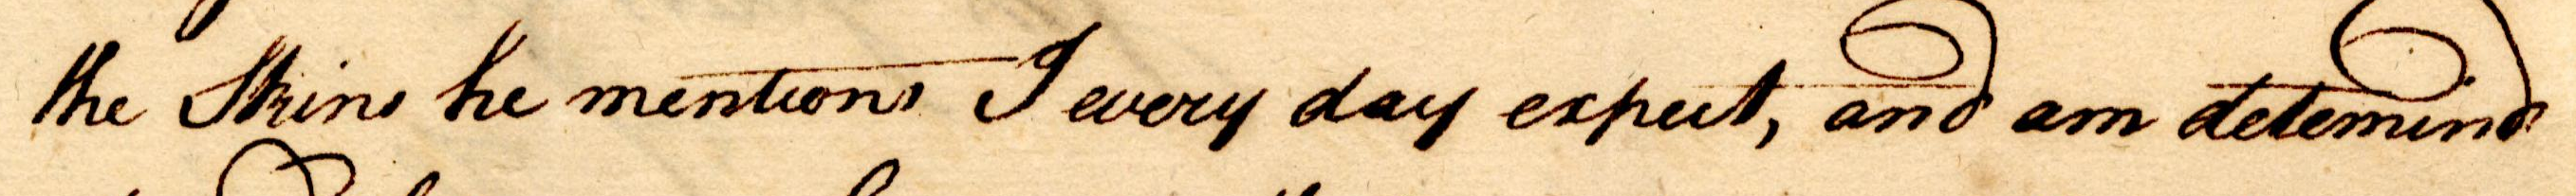the skins he mentions I every day expect, and am determined
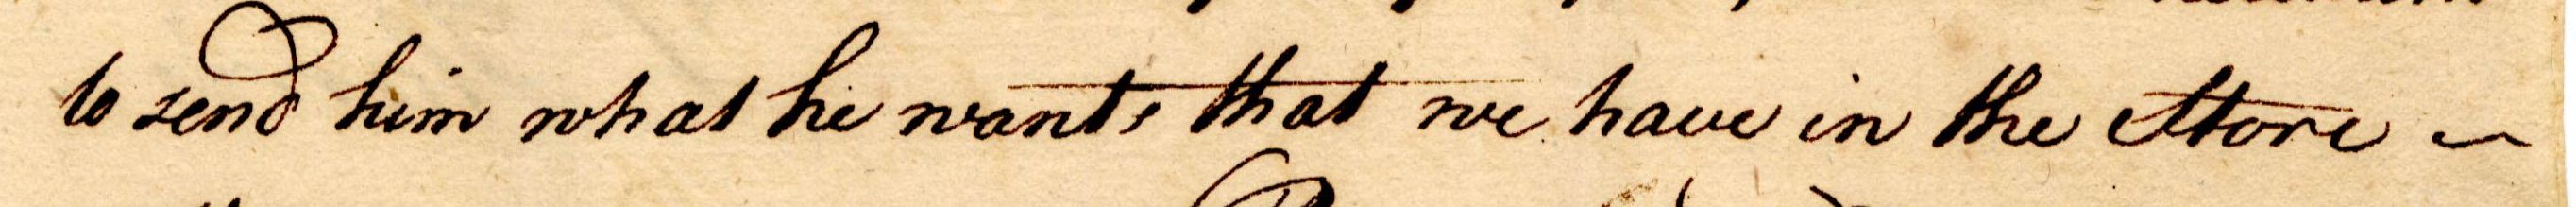to send him what he wants, that we have in the store -
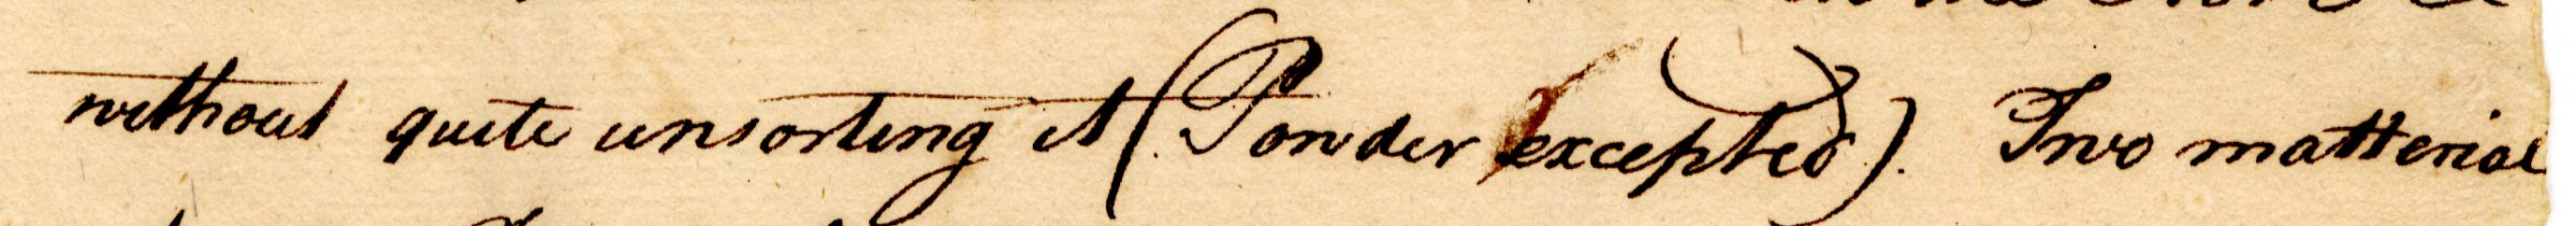without quite unsorting it (Powder excepted). Two matterial
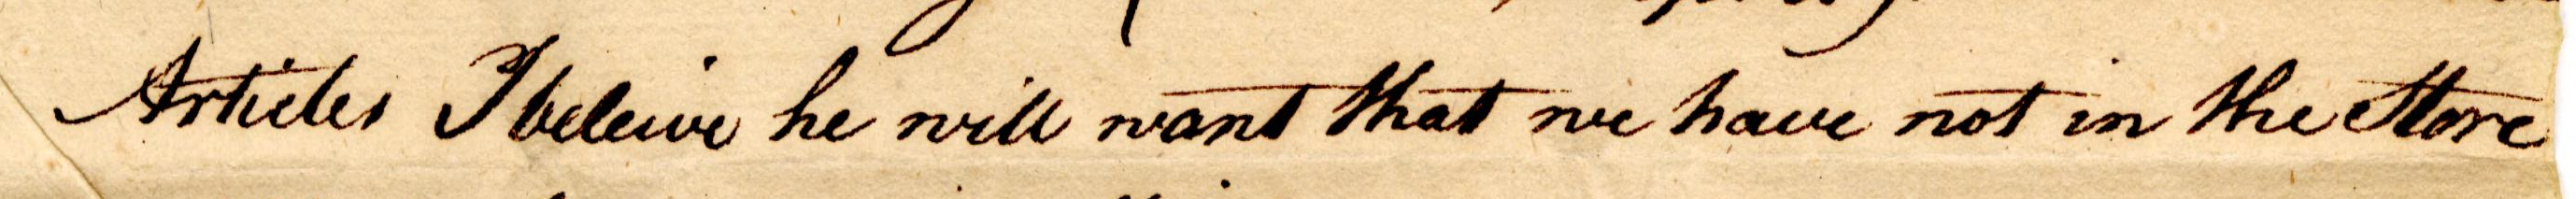Articles I beleive he will want that we have not in the store
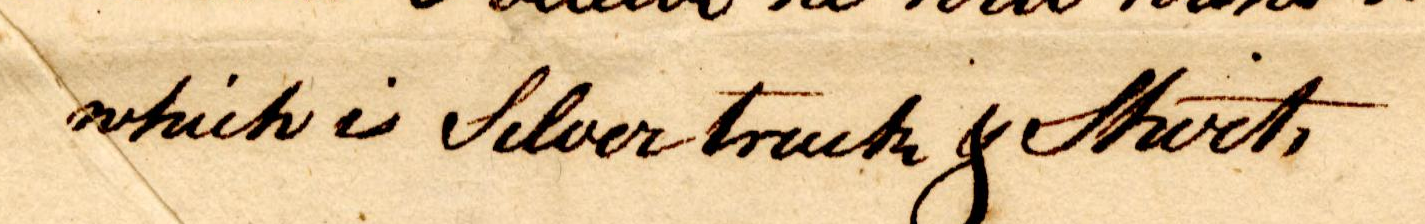which is silver trunk & shirt,
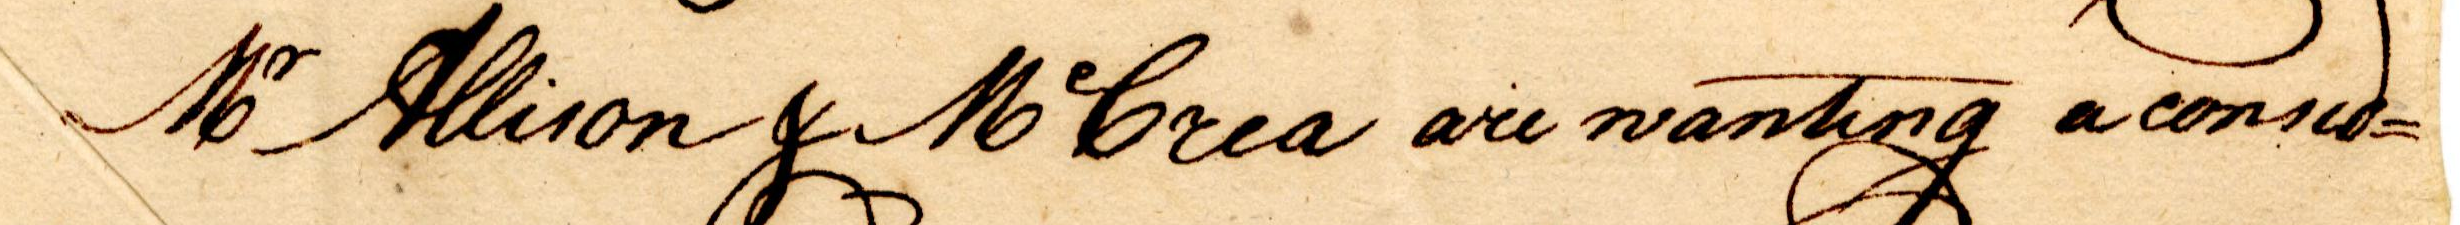M^r Adrian & M^cCrea are wanting a consid-
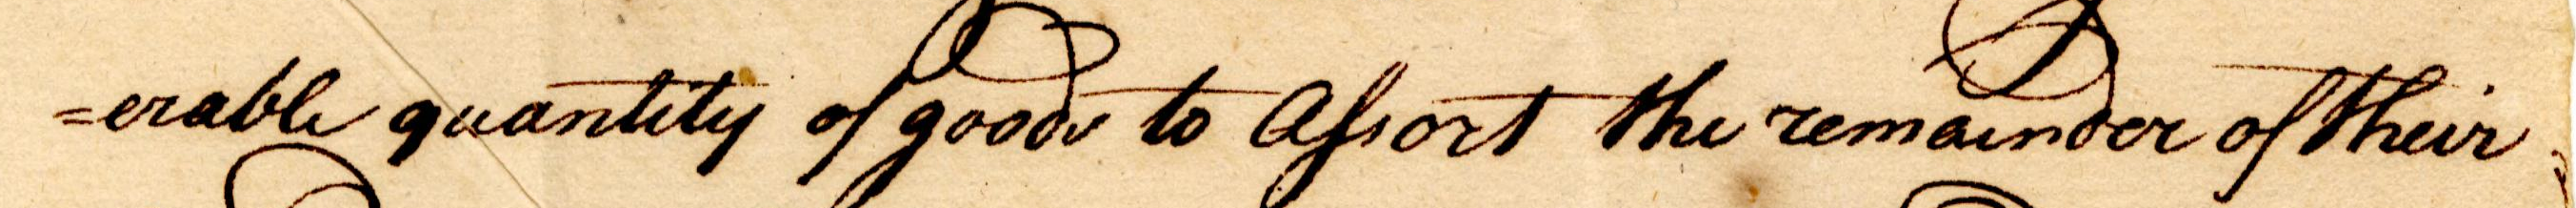-erable quantity of goods to assort the remainder of their
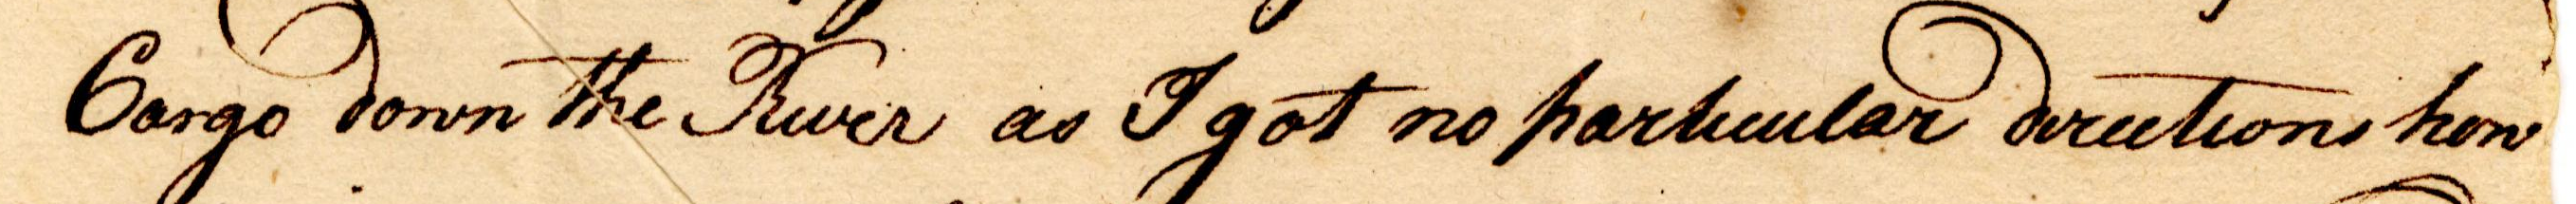Cargo down the River as I got no particular directions how
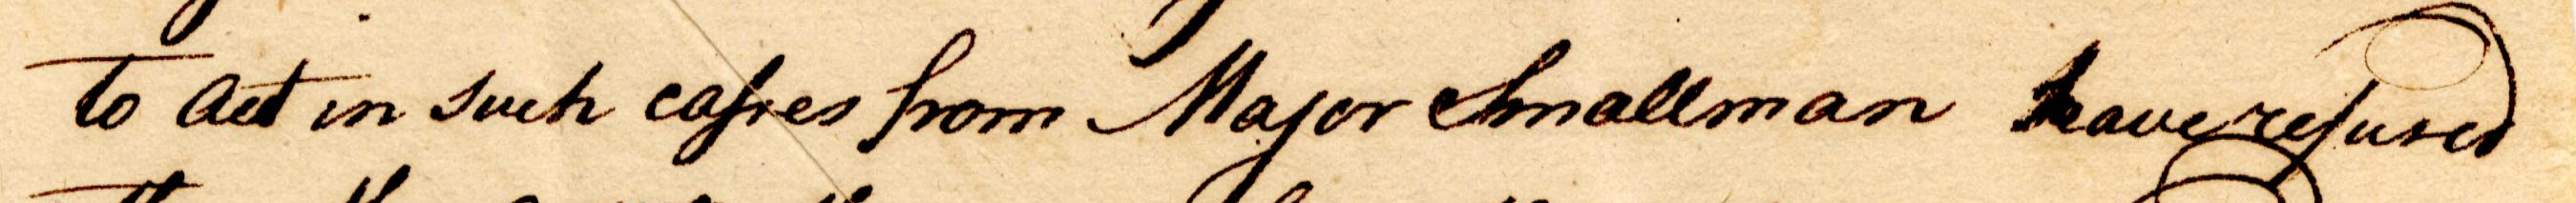to act in such casses from Major Smallman have refused
